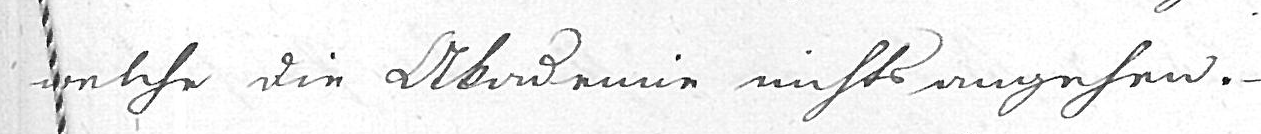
welche die Akademie nichts angehen.
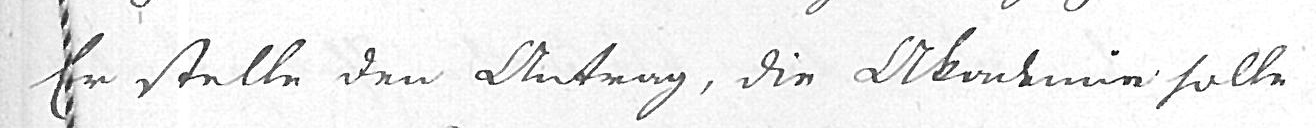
Er stelle den Antrag, die Akademie sollte
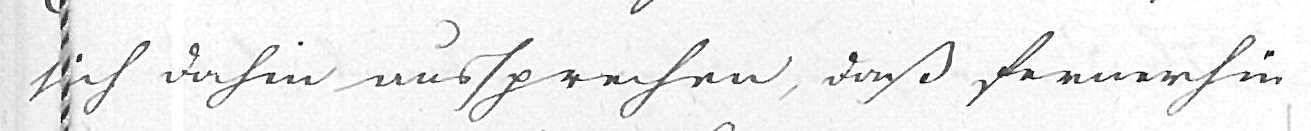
sich dahin ausprechen, daß fernerhin
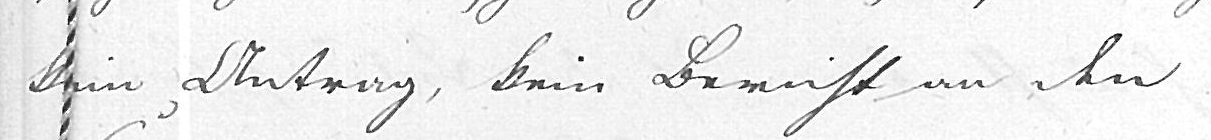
kein Antrag, kein Bericht an den
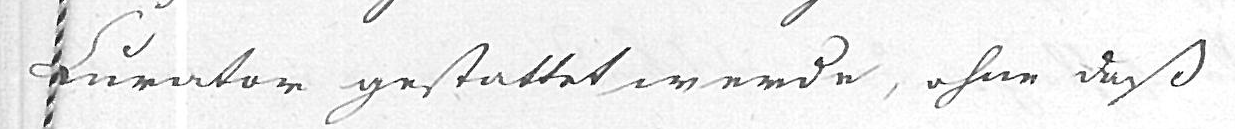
Curator gestattet werde, ohne daß
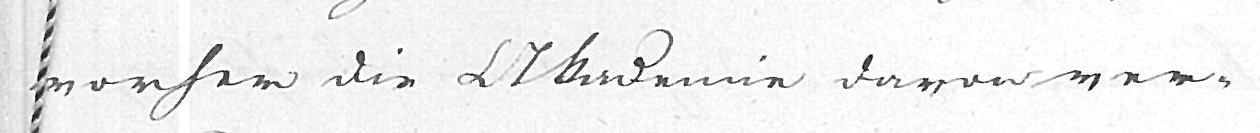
vorher die Akademie davon ver-
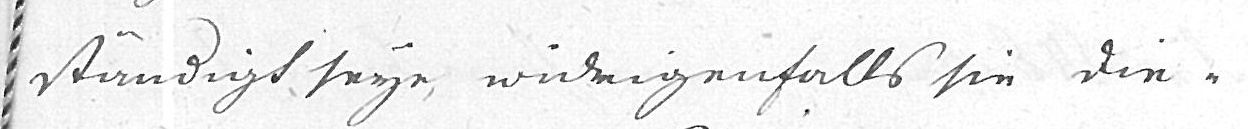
ständigt seye, widrigenfalls sie die-
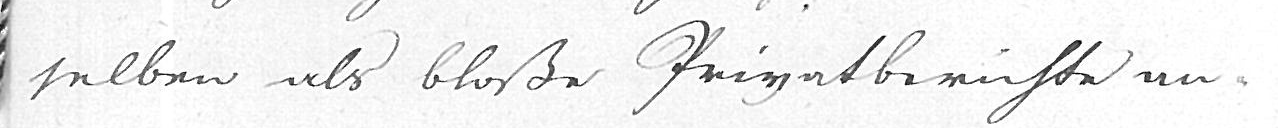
selben als bloße Privatberichte an-
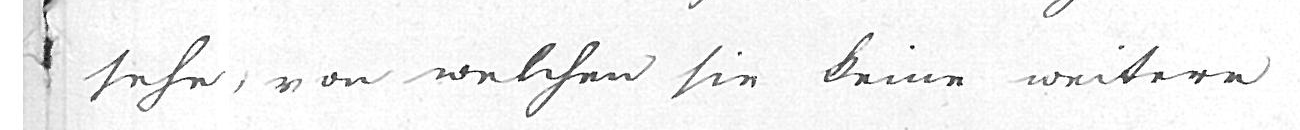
sehe, von welchen sie keine weitere
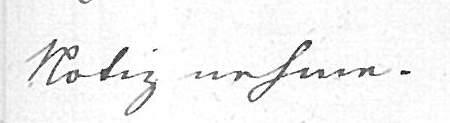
Notiz nehme.
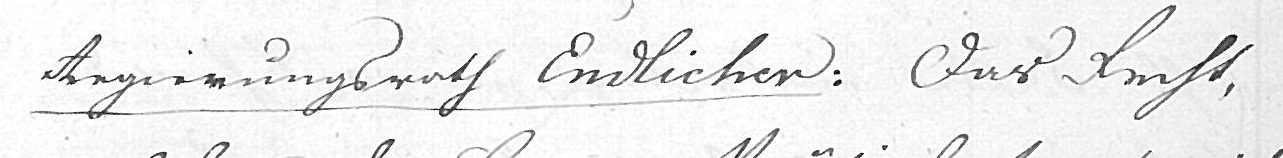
Regierungsrath Endlicher: Das Recht,
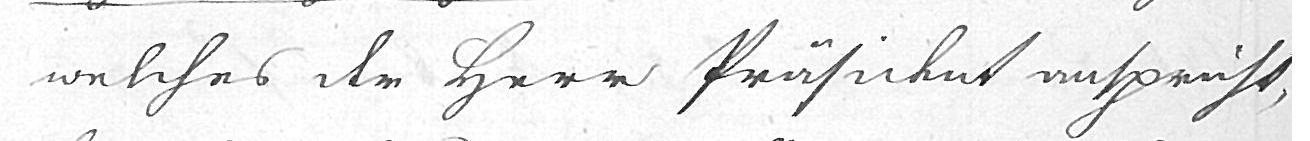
welche der Herr Präsident anspricht,
